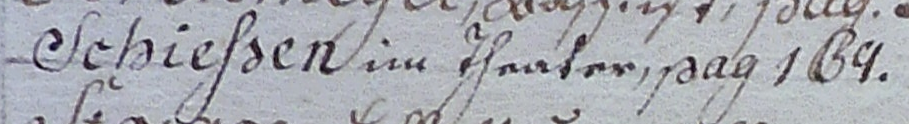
Schiessen im Theater, pag 169.
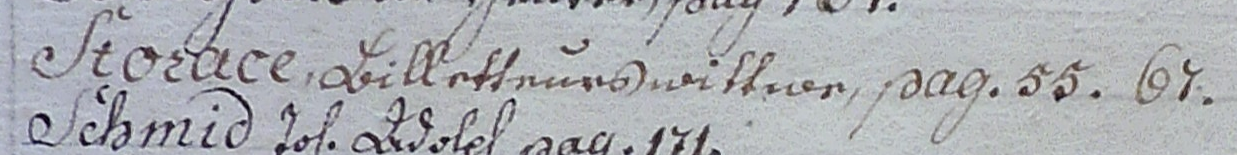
Storace, Billetteurswittwe, pag. 55. 67.
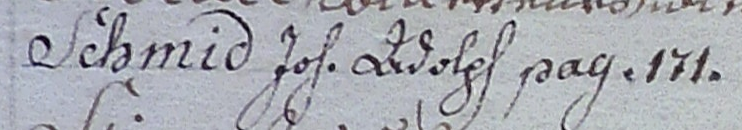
Schmid Joh. Adolph pag. 171.
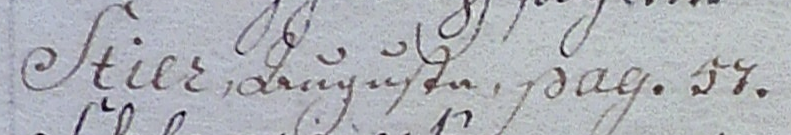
Stier, Augusta, pag. 57.
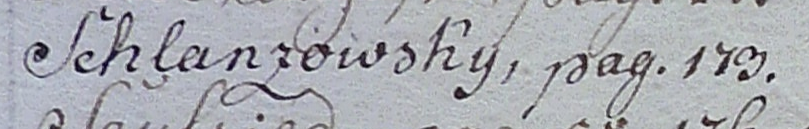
Schlanzowsky, pag. 173..
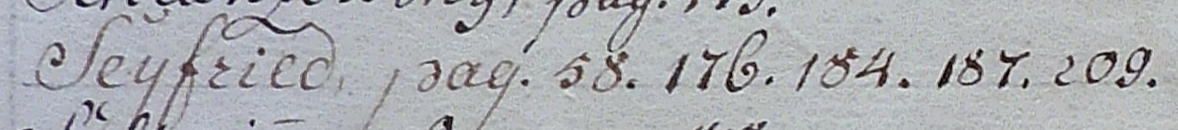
Seyfried, pag. 58. 176. 184. 187. 209.
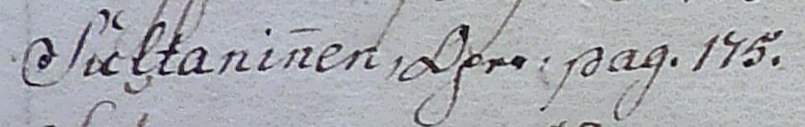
Sultanin̅en, Oper, pag. 175.
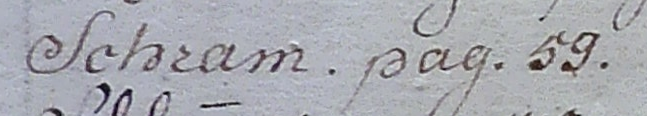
Schram. pag. 59.
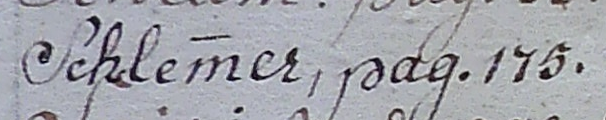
Schlem̅er, pag. 175.
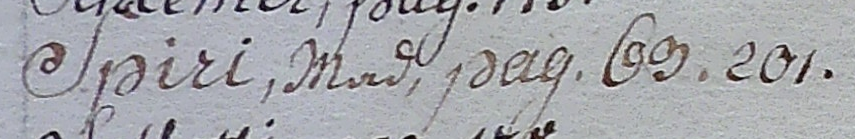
Spiri, Mad, pag. 63. 201.
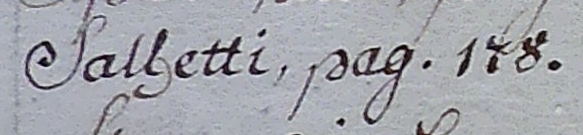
Salleti, pag. 178.
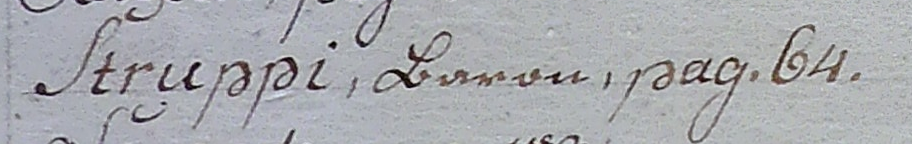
Struppi, Baron, pag. 64.
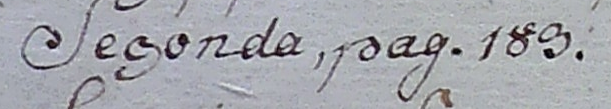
Seconda, pag. 183.
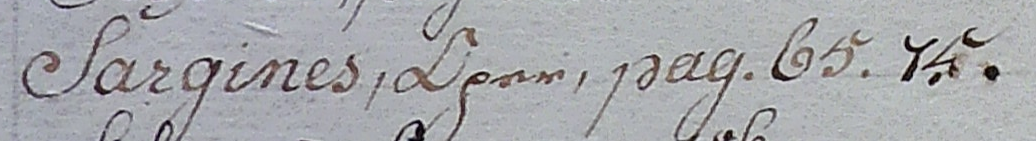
Sargines, Oper, pag. 65. 75.
